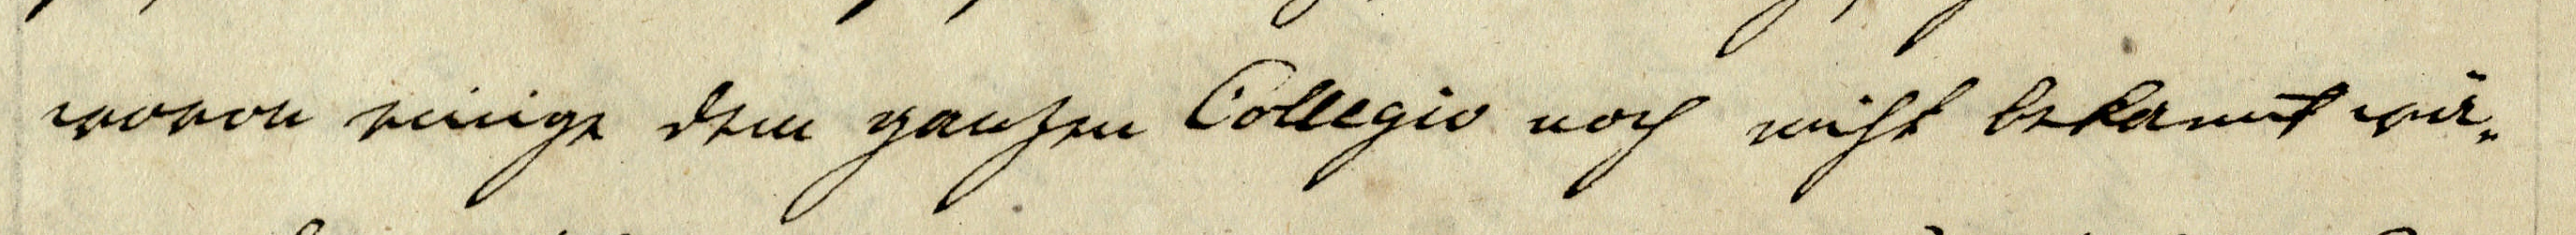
wovon einige dem ganzen Collegio noch nicht bekannt wä¬
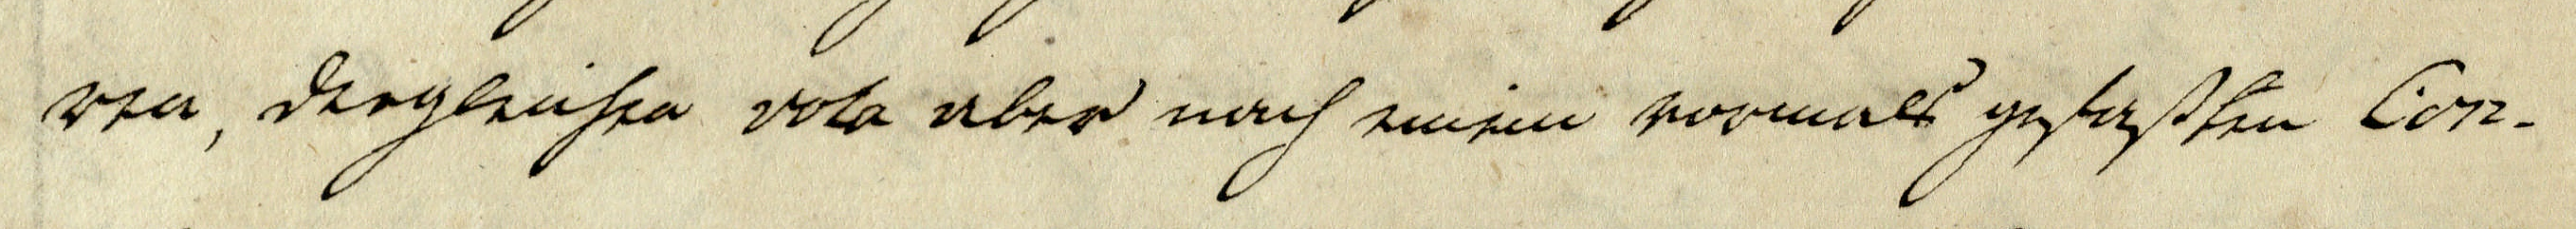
ren, dergleichen vota aber nach einem vormals gefaßten Con¬
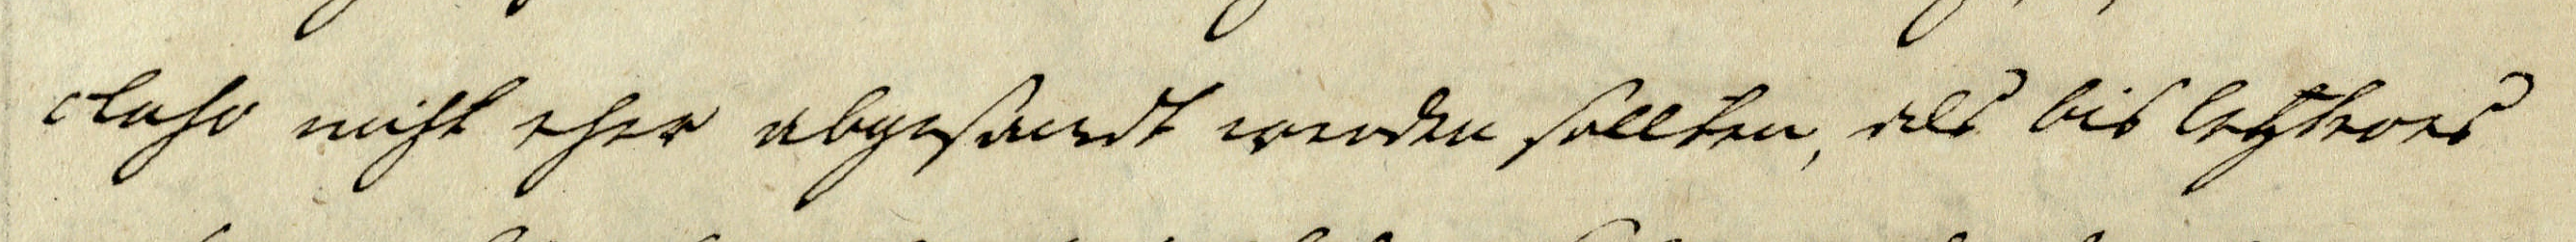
cluso nicht eher abgesandt werden sollten, als bis letzteres
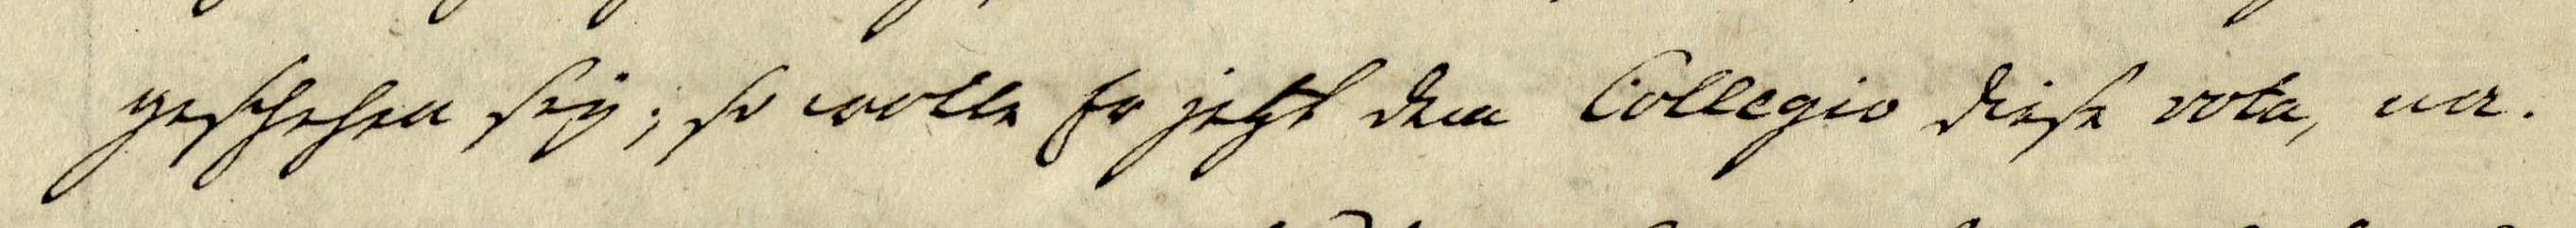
geschehen seÿ; so wolle Er jetzt dem Collegio diese vota, na¬
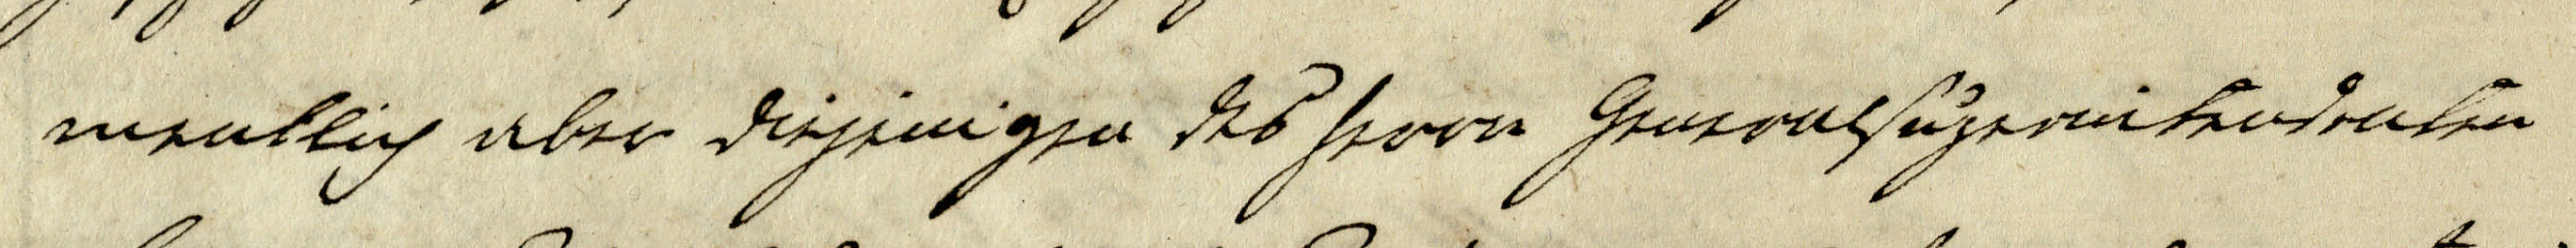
mentlich aber diejenigen des Herrn Generalsuperintendenten
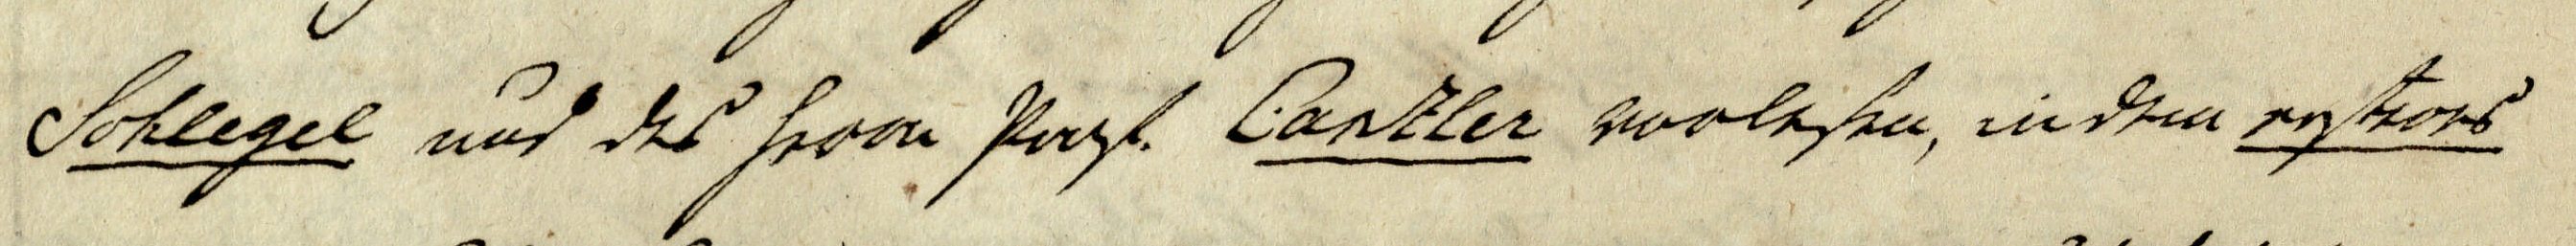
Schlegel und des Herrn Prof. Canzler vorlesen, indem ersteres
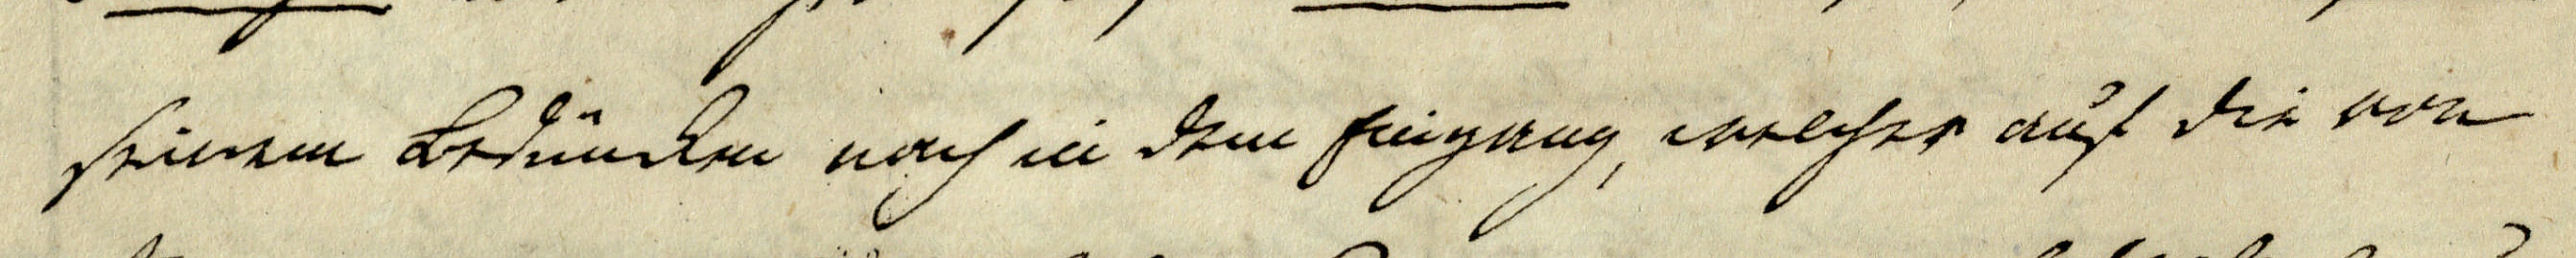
seinem Bedüncken nach in dem Eingang, welcher auf die von
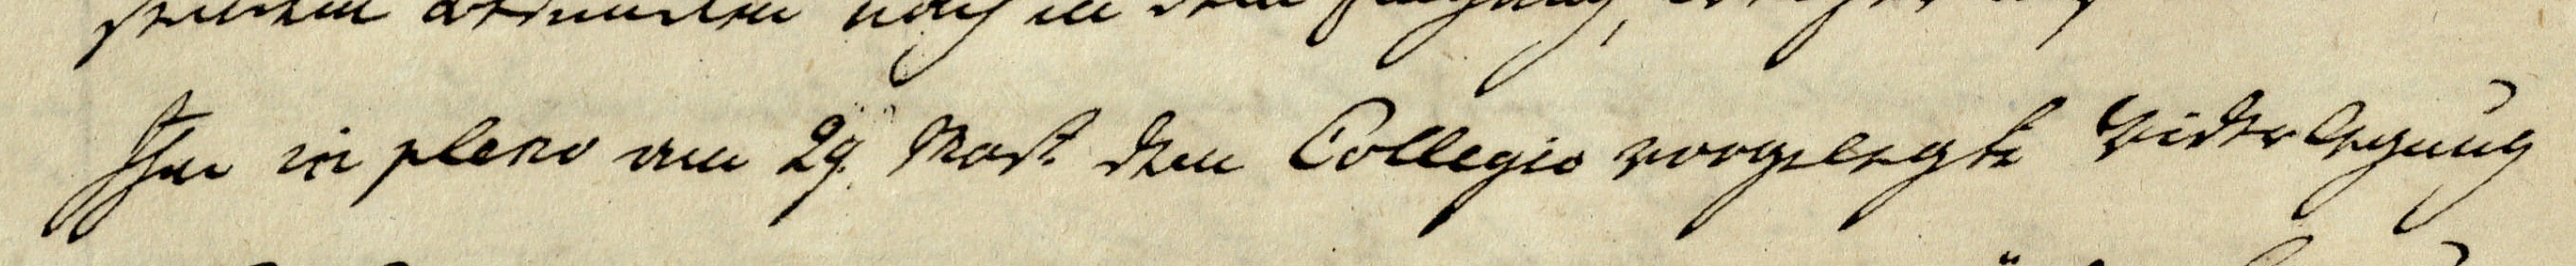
Ihm in pleno am 29 Mart dem Collegio vorgelegte Widerlegung
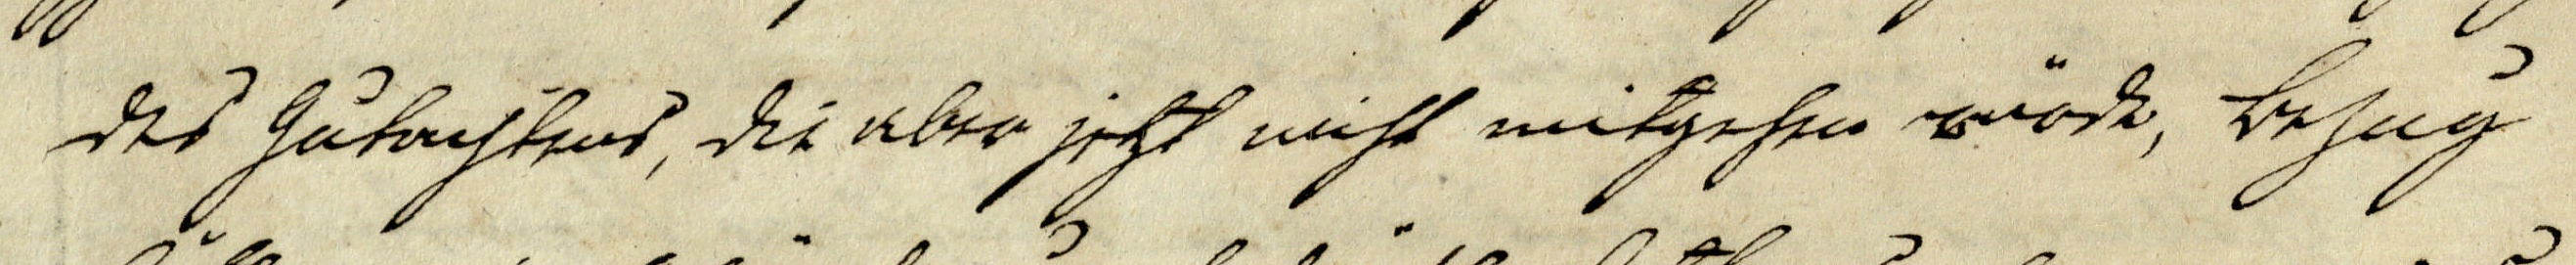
des Gutachtens, die aber jetzt nicht mitgehen würde, Bezug
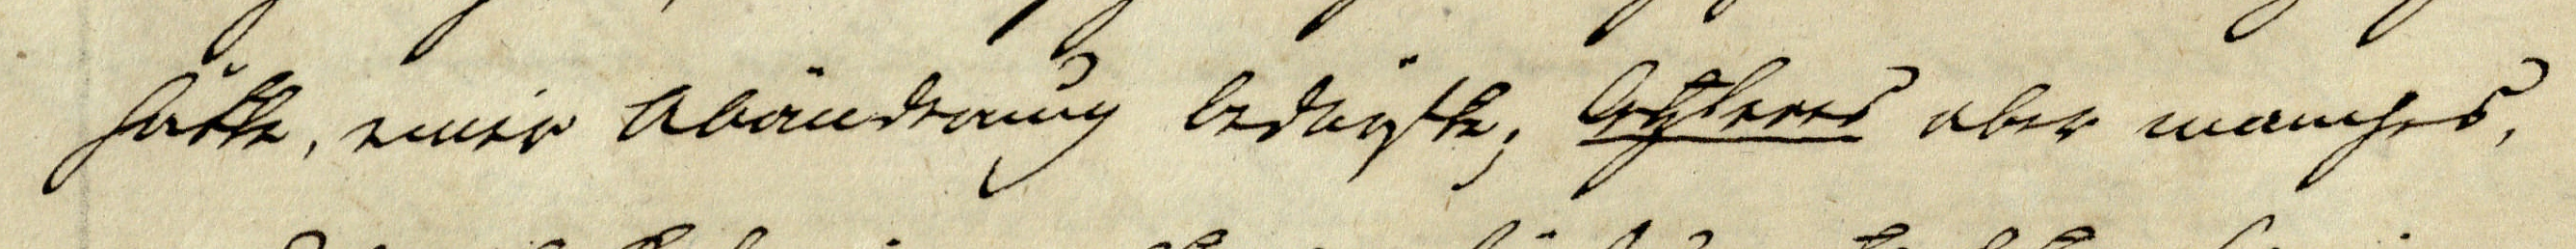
hätte, einer Abänderung bedürfte; letzteres aber manches,
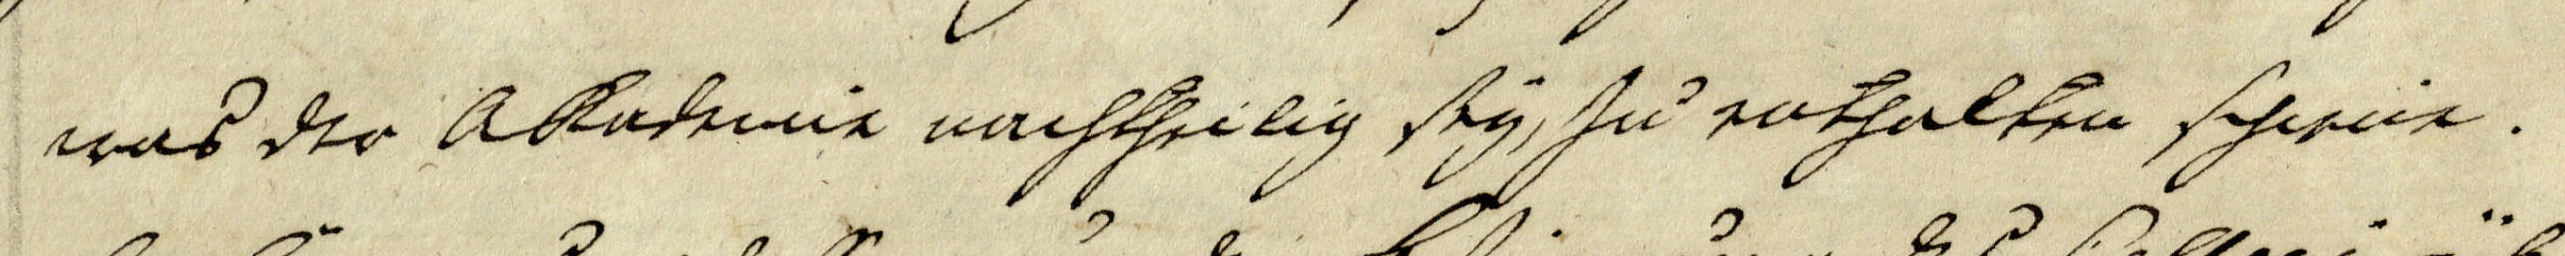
was der Akademie nachtheilig seÿ, zu enthalten scheine.
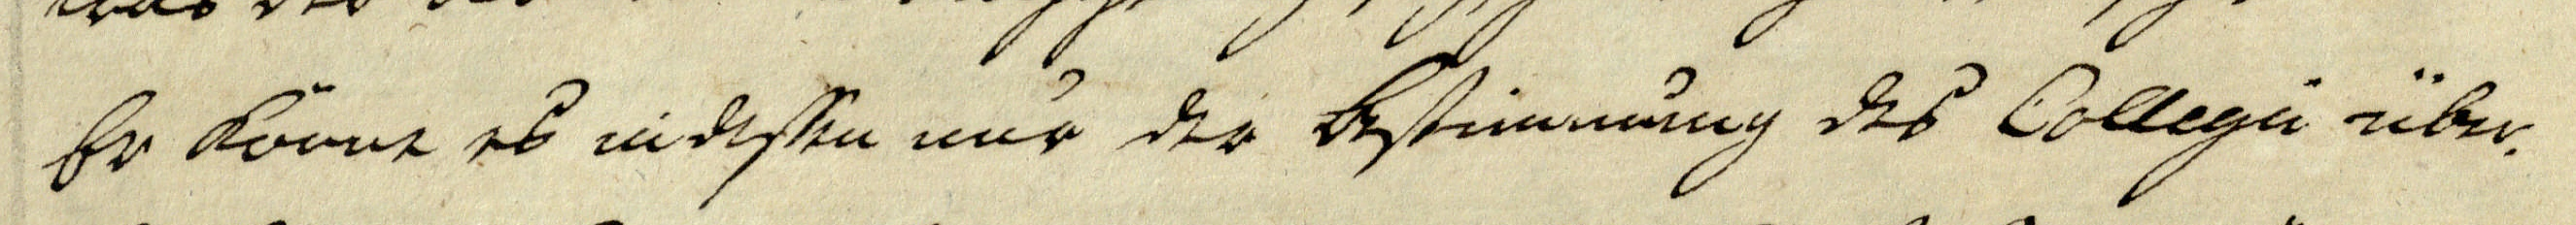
Er könne es indessen nur der Bestimmung des Collegii über¬
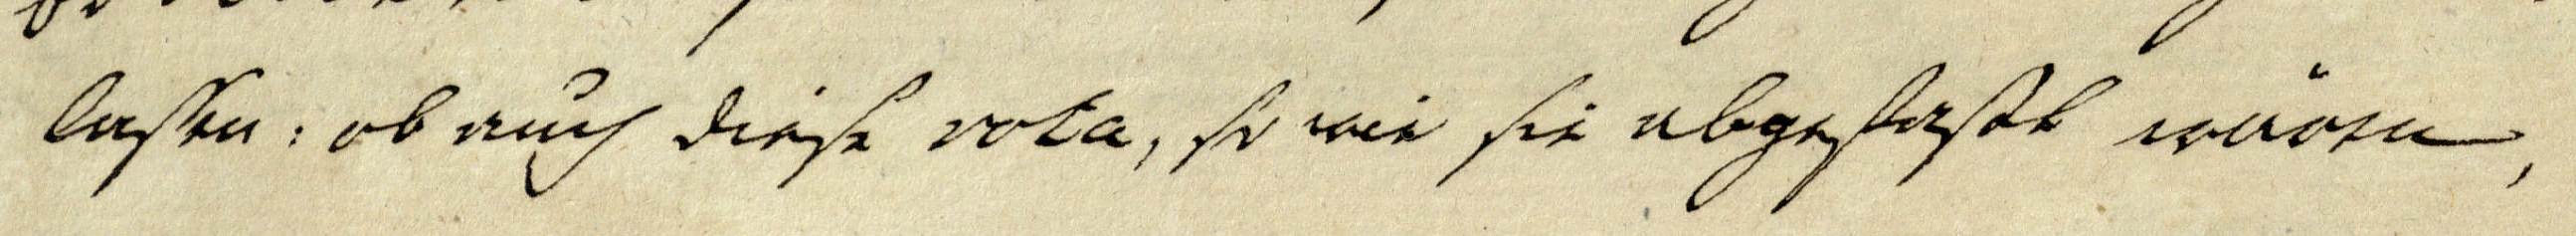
lassen, ob auch diese vota, so wie sie abgefaßt wären,
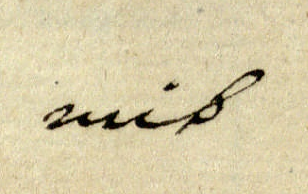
mit
